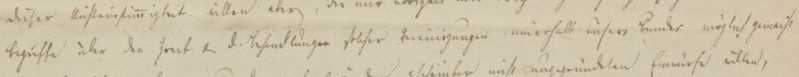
Begriffe über den Zweck & d. Behandlungen solcher Vereinigungen innerhalb unsers Bundes möglich gemacht
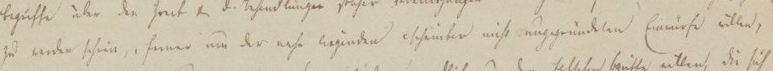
zu werden schien, ferner um der nahe liegenden & scheinbar nicht ungegründeten Einwürfe willen,
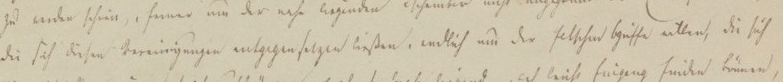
die sich diesen Vereinigungen entgegensetzen ließen, endlich um der falschen Begriffe willen, die sich
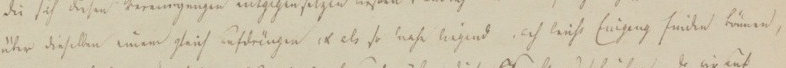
über dieselben einem gleich aufdrängen, & als so nahe liegend, auch leicht Eingang finden können,
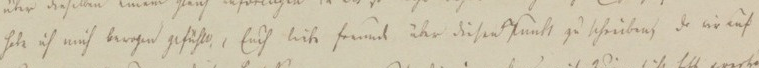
habe ich mich bewogen gefühlt, Euch liebe Freunde über diesen Punkt zu schreiben, da wir auf
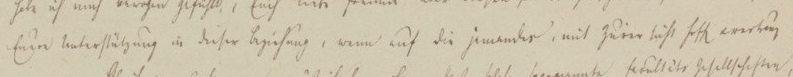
Euere Unterstützung in dieser Beziehung, wenn auf die jemandes, mit Zuversicht hoffen & vertrauen.
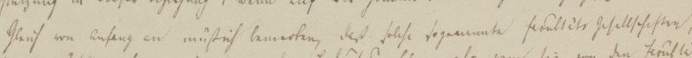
Gleich von Anfang an muß ich bemerken, daß solche sogenannte Facultäts Gesellschaften,
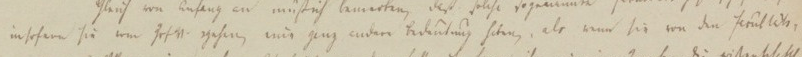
insofern sie vom Zof.V. gehen, eine ganz andere Bedeutung haben, als wenn sie von den Facultäts-
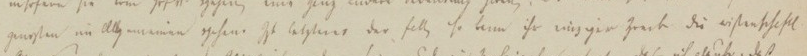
genossen im Allgemeinen gehen. Ist letzteres der Fall, so kann ihr einziger Zweck die wissenschaftl.
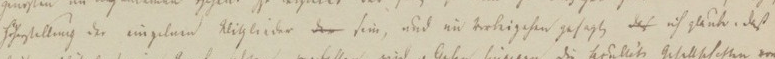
Höherstellung der einzelnen Mitglieder der sein, und im Vorbeigehen gesagt, daß ich glaube, daß
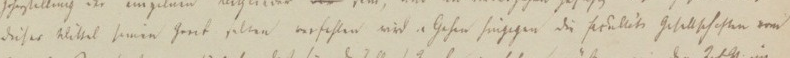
dieses Mittel seinen Zweck selten verfehlen wird. Gehen hingegen die Facultäts Gesellschaften vom
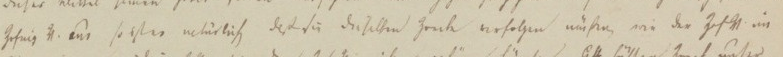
Zofing.V. aus so ist es natürlich, daß sie denselben Zweck verfolgen müssen, wie der Zof.V. im
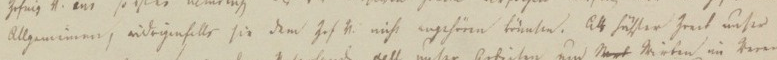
Allgemeinen, widrigenfalls sie dem Zof.V. nicht angehören könnten. Als höchster Zweck unsers
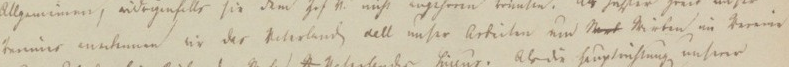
Vereins anerkennen wir das Vaterland, & all unser Arbeiten und Werk Wirken im Vereine
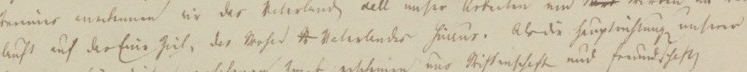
läuft auf das Eine Ziel, das Wohl d. Vaterlandes hinaus. Als die Hauptrichtungen unserer
